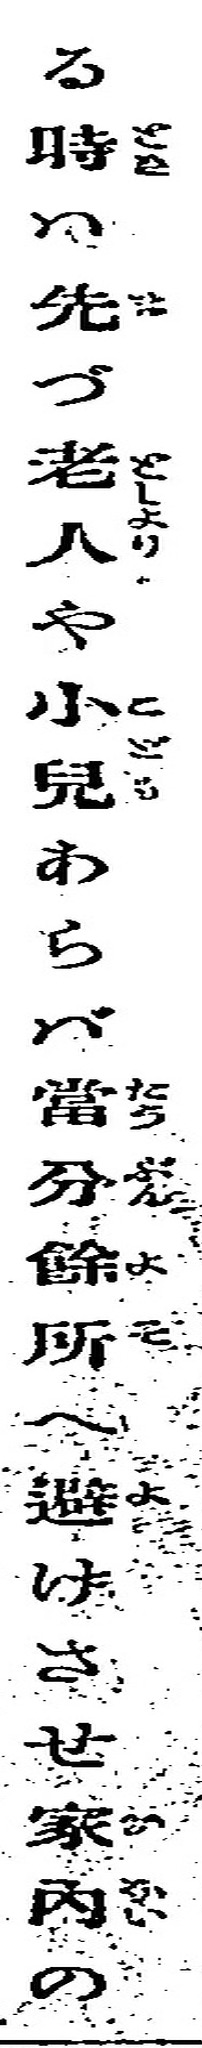る時は先づ老人や小兒あらば當分餘所へ避けさせ家内の
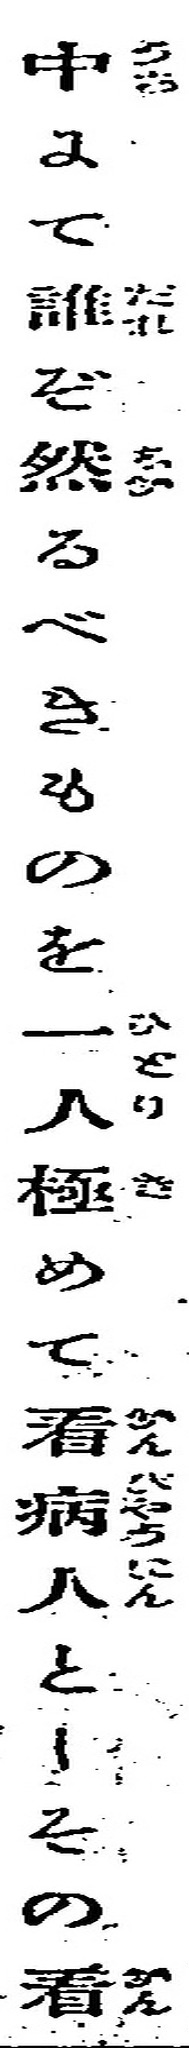中にて誰ぞ然るべきものを一人極めて看病人としその看
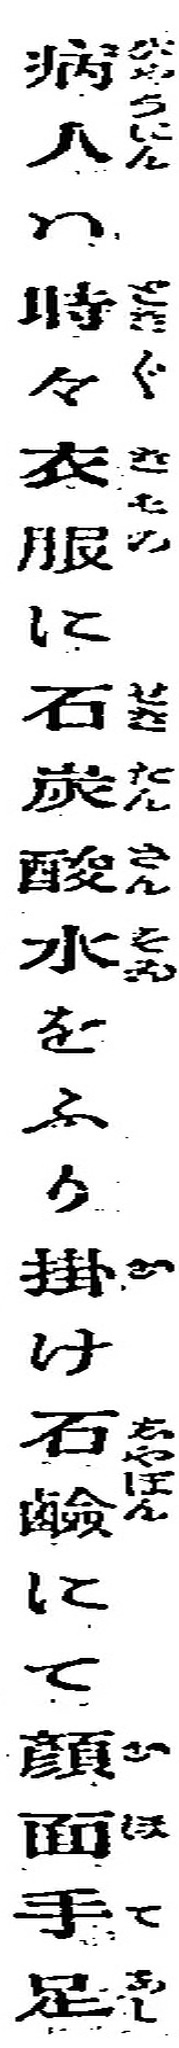病人は時々衣服に石炭酸水をふり掛け石鹸にて顔面手足
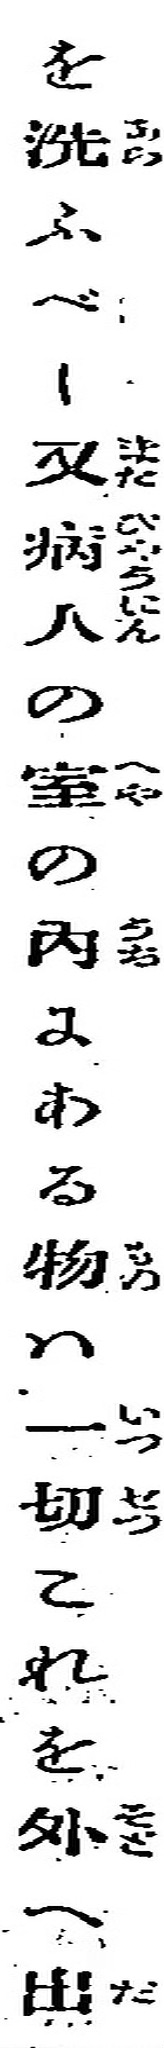を洗ふべし又病人の室の内にある物は一切これを外へ出
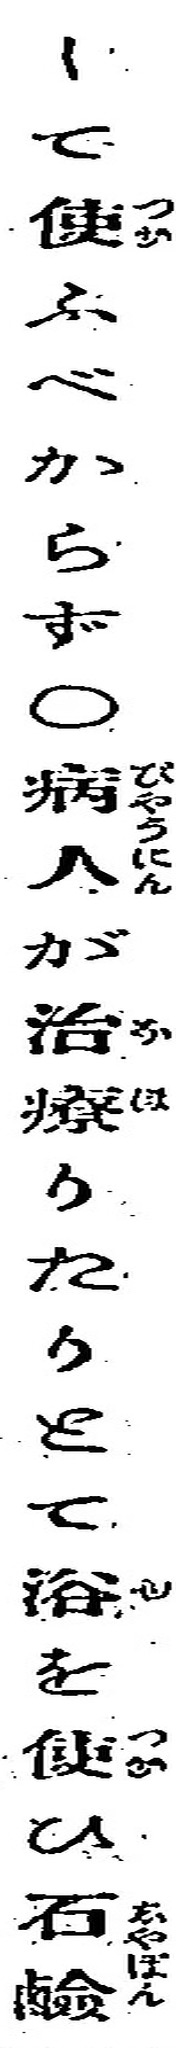して使ふべからず〇病人が治療りたりとて浴を使ひ石鹸
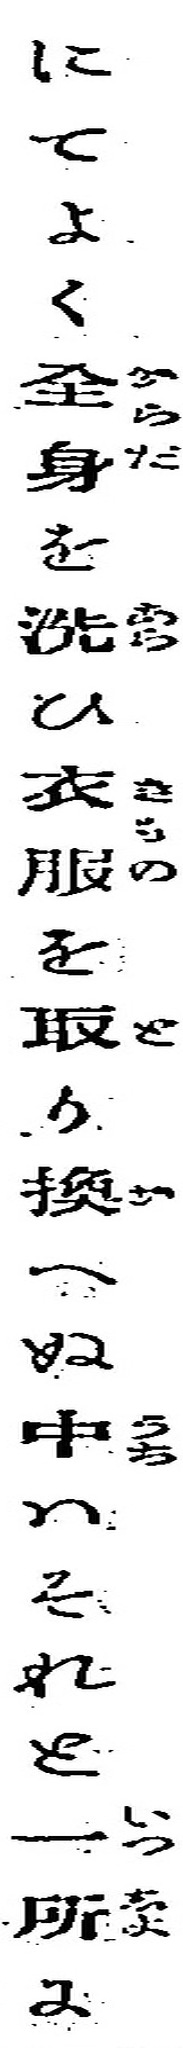にてよく全身を洗ひ衣服を取り換へぬ中はそれと一所に
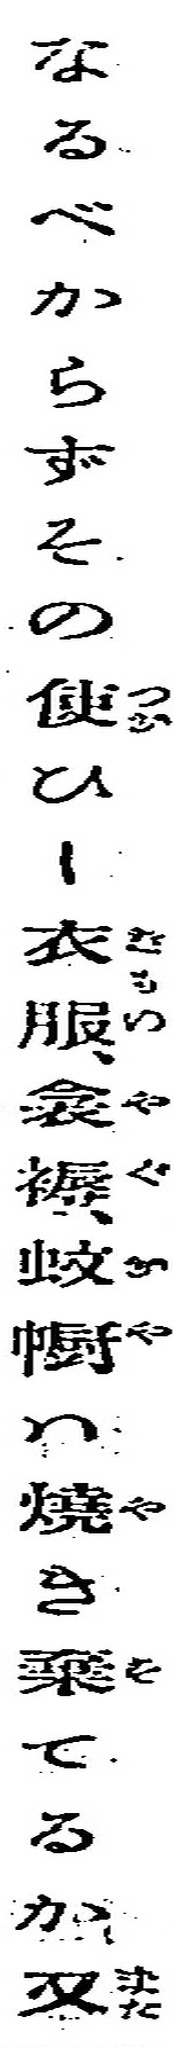なるべからずその使ひし衣服、衾褥、蚊幮は焼き棄てるか又
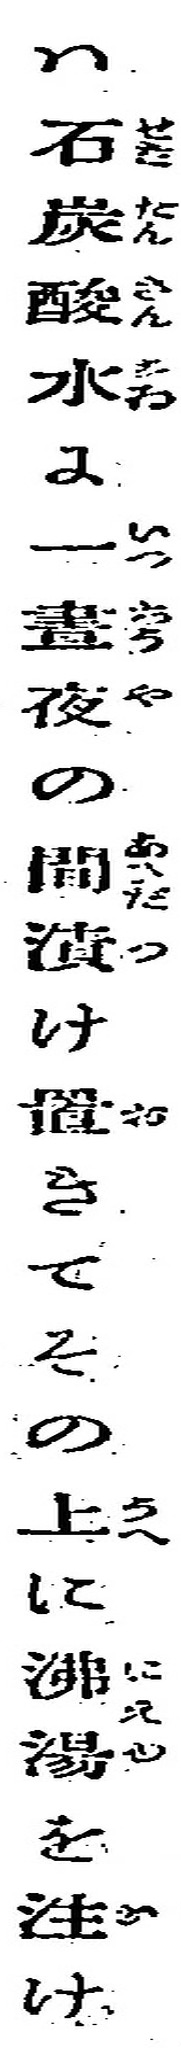は石炭酸水に一晝夜の間漬け置きてその上に沸湯を注け
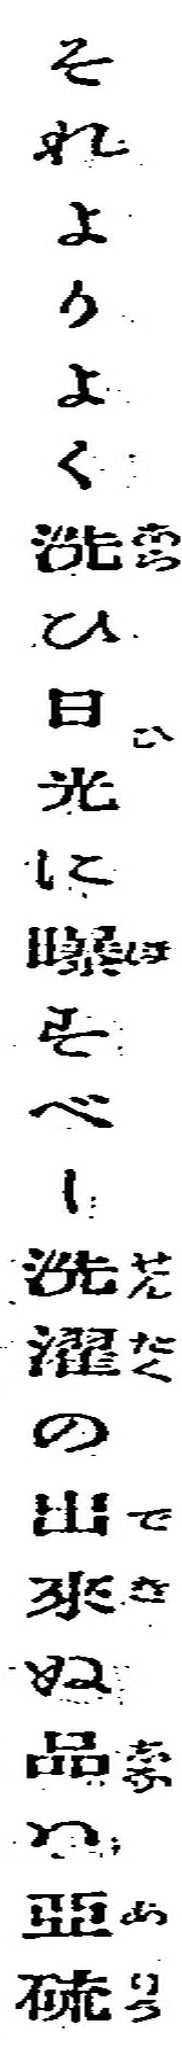それよりよく洗ひ日光に曝すべし洗濯の出來ぬ品は亞硫
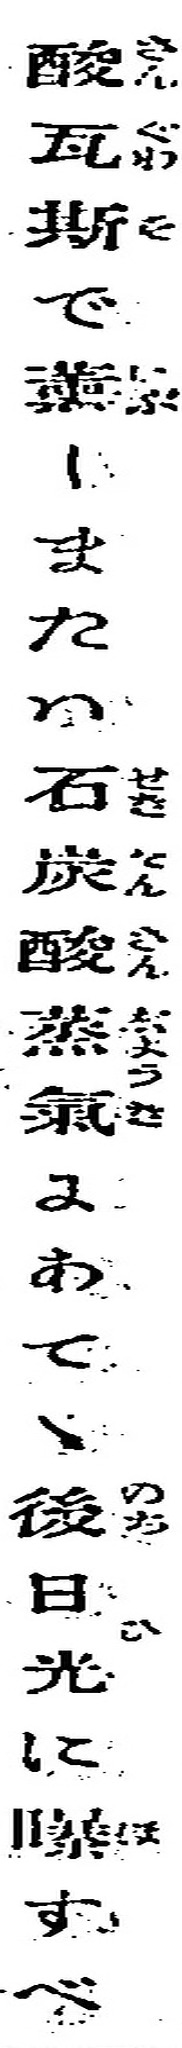酸瓦斯で熏しまたは石炭酸蒸気にあてゝ後日光に曝すべ
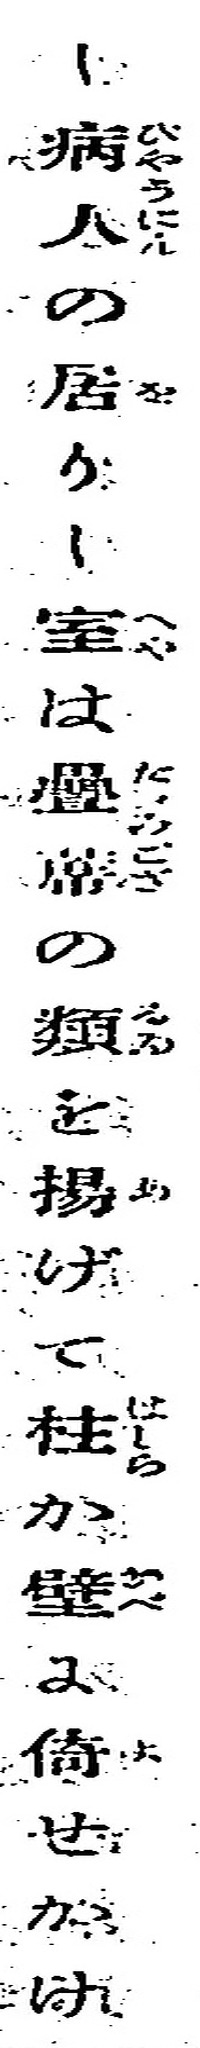し病人の居りし室は畳蓆の類を揚げて柱か壁に倚せかけ
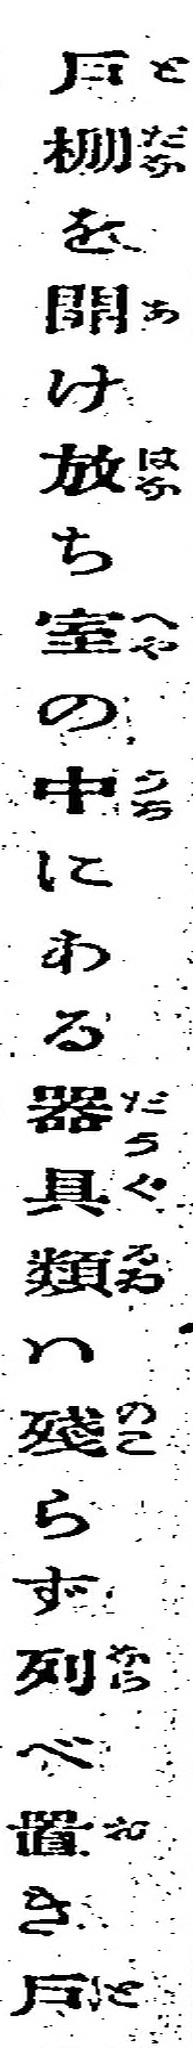戸棚を開け放ち室の中にある器具類は残らず列べ置き戸
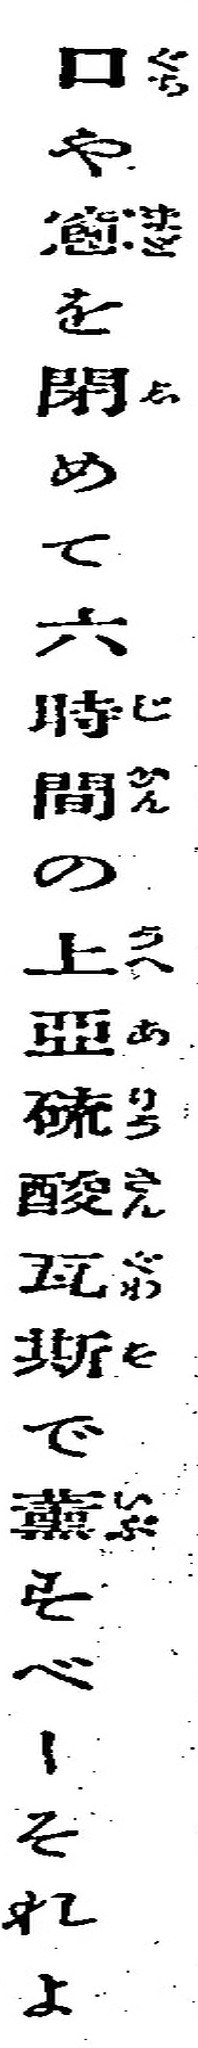口や窓を閉めて六時間の上亞硫酸瓦斯で熏すべしそれよ
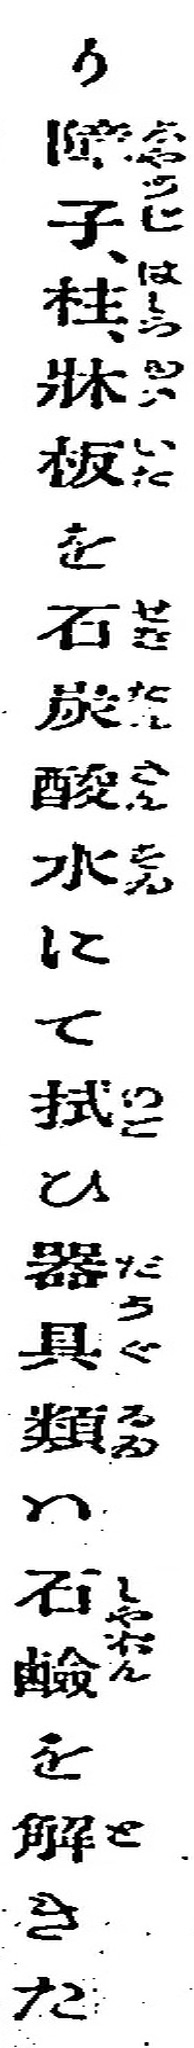り障子、柱、牀板を石炭酸水にて拭ひ器具類は石鹸を解きた
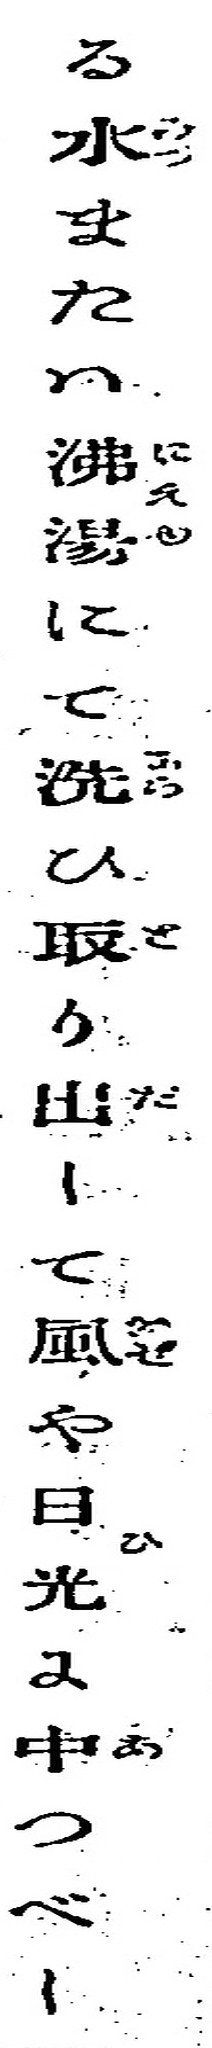る水または沸湯にて洗ひ取り出して風や日光に中つべし
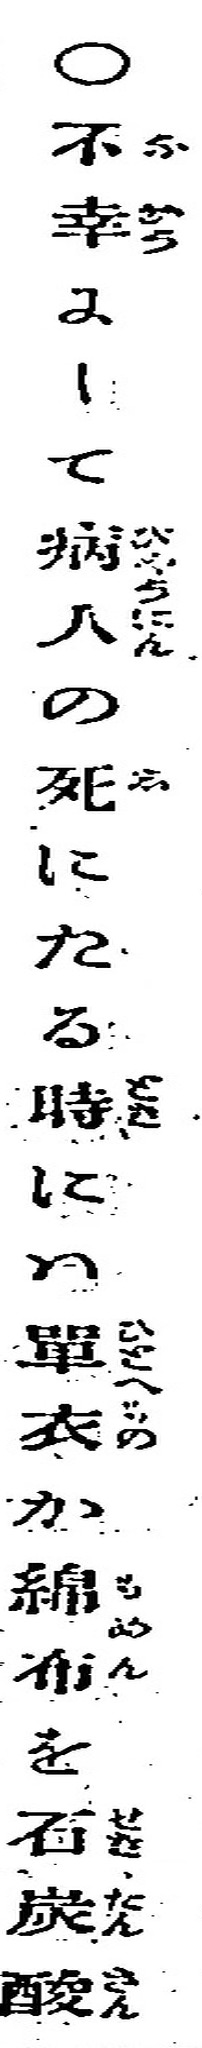〇不幸にして病人の死にたる時には単衣か木綿を石炭酸
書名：発疹窒扶私予防の訓
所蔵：国立国会図書館 National Diet Library, JAPAN
